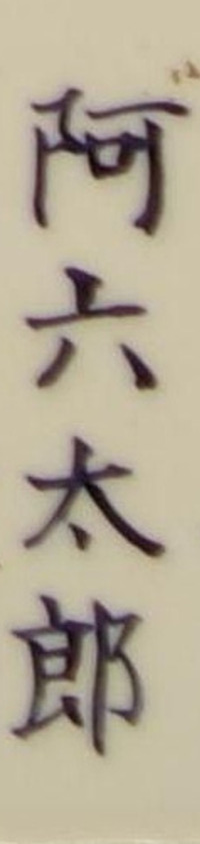阿六太郎
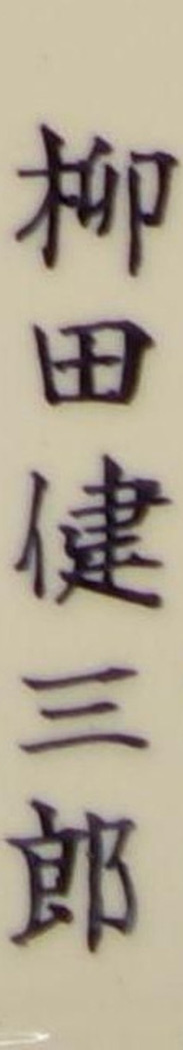柳田健三郎
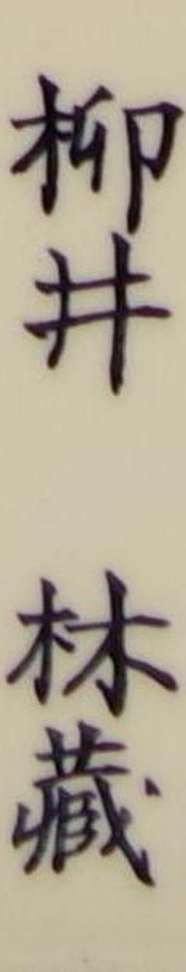柳井林蔵
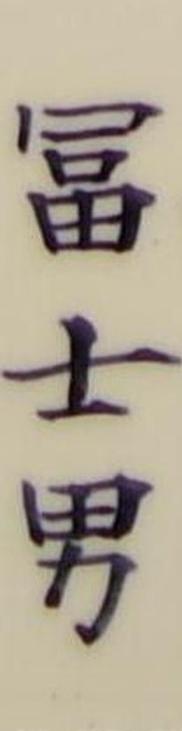冨士男
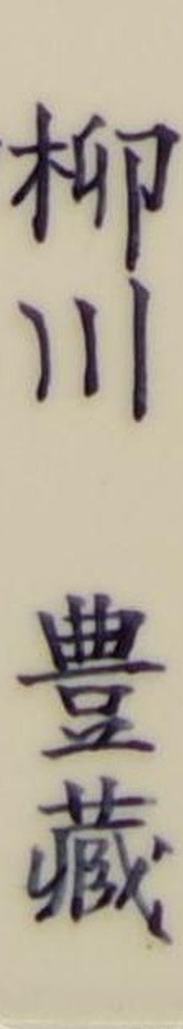柳川豊蔵
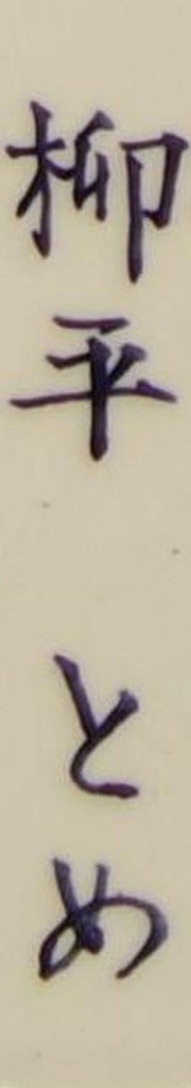柳平とめ
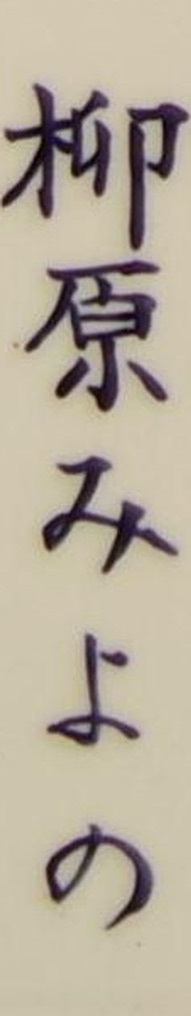柳原みよの
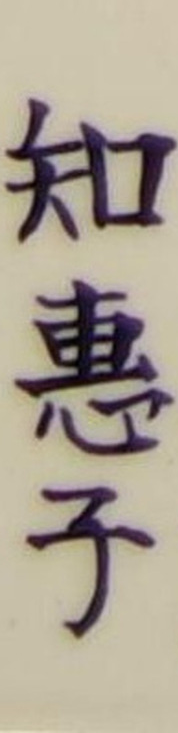知恵子
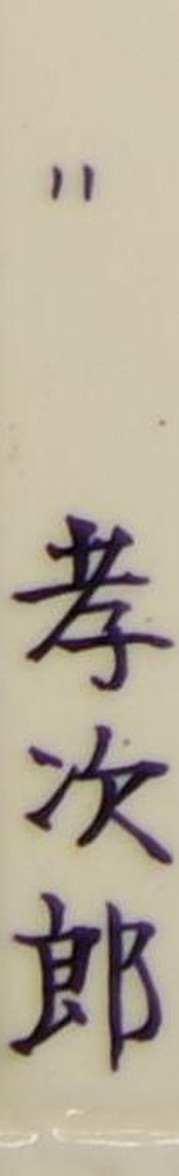孝次郎
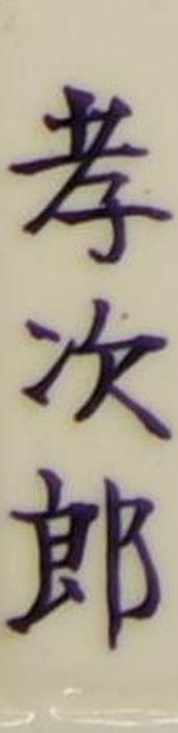孝次郎

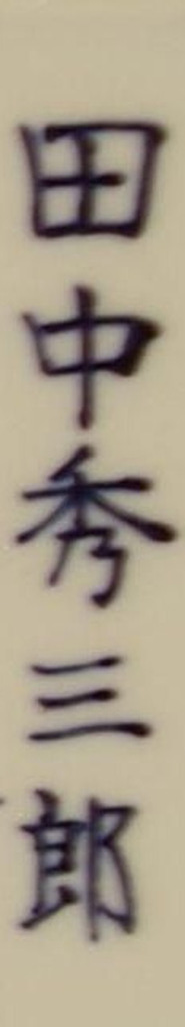田中秀三郎
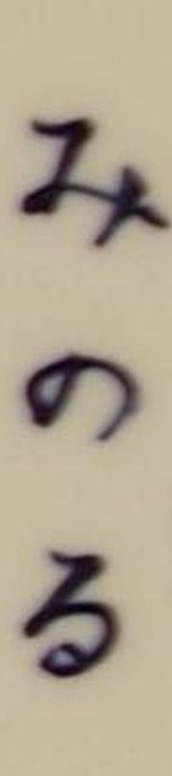みのる
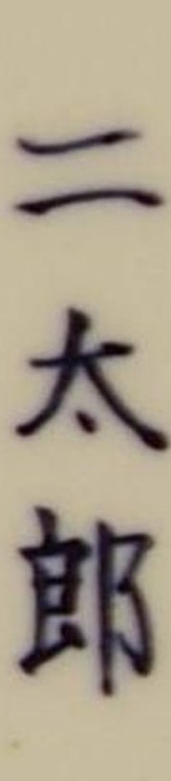二太郎
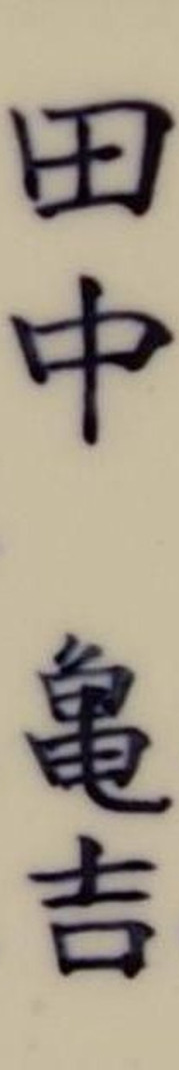田中亀吉
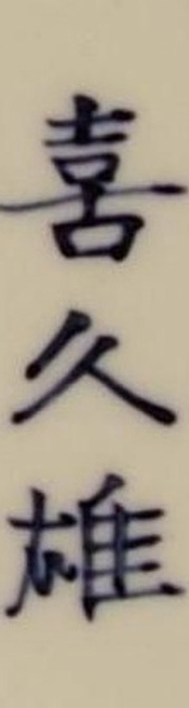喜久雄
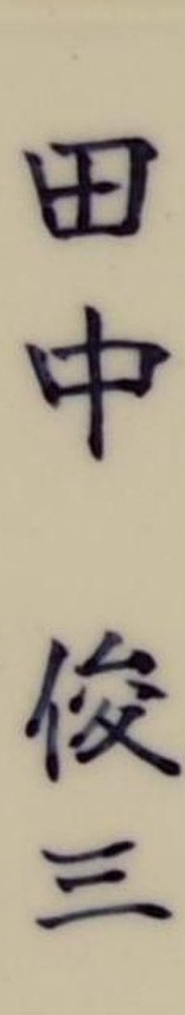田中俊三
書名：A~D
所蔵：koyasan kongobuji
